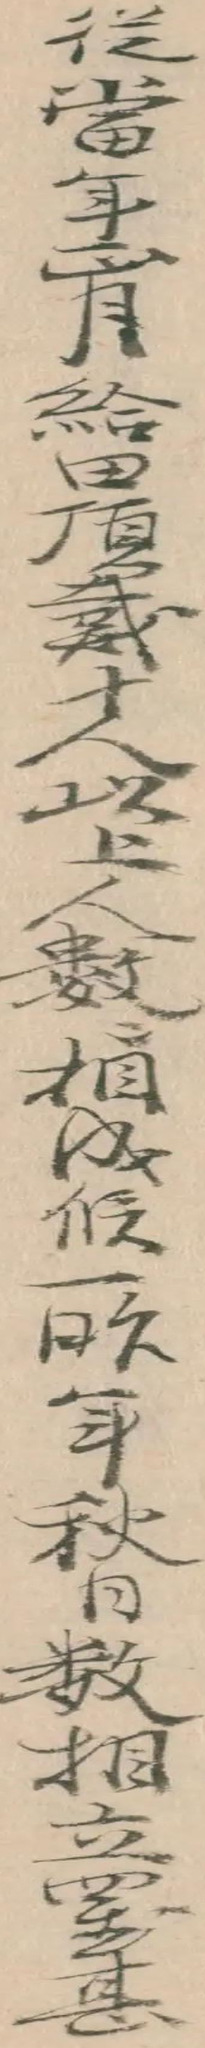従當年正月給田頂戴十人以上人數ニ相成候一昨年秋日数相立置甚
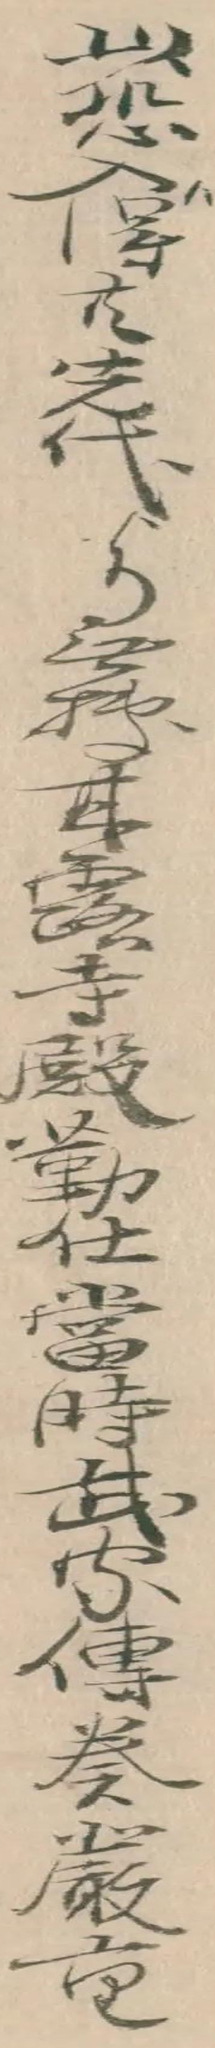以恐入候得共先代より無拠甘露寺殿勤仕當時武家傳奏厳重
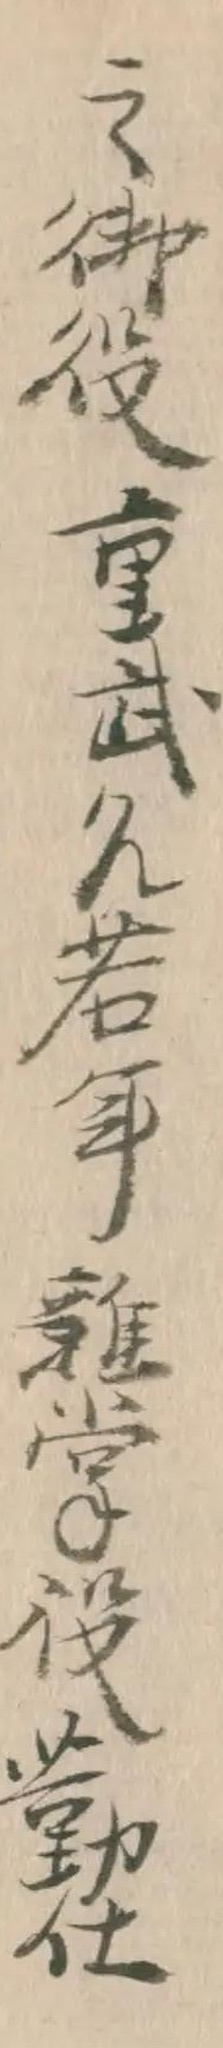之御役重武乍若年雑掌役勤仕
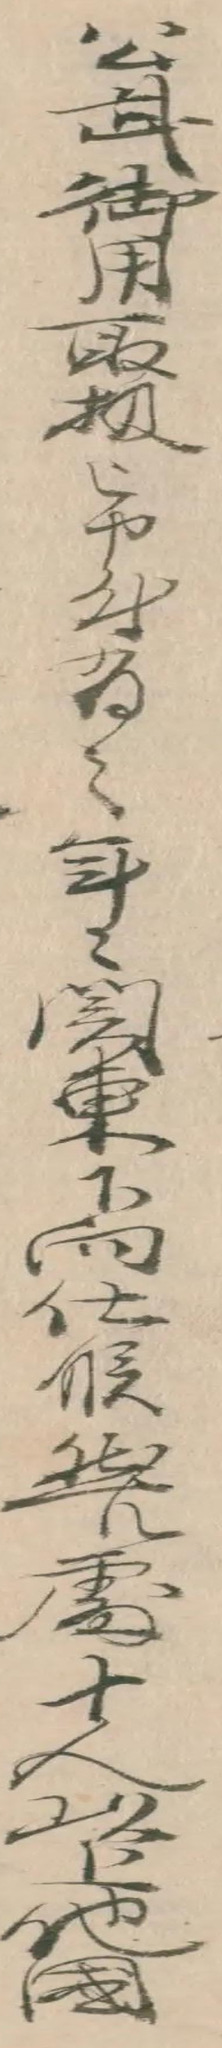公武御用取扱被申付有之年々関東下向仕候然ル處十人以上他國
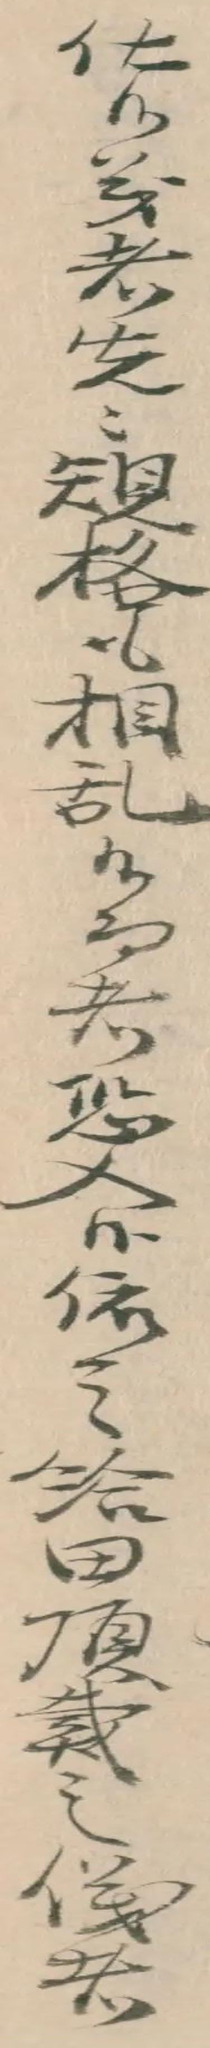仕候義者先〃規格も相乱候而者恐入候依之給田頂戴之儀者
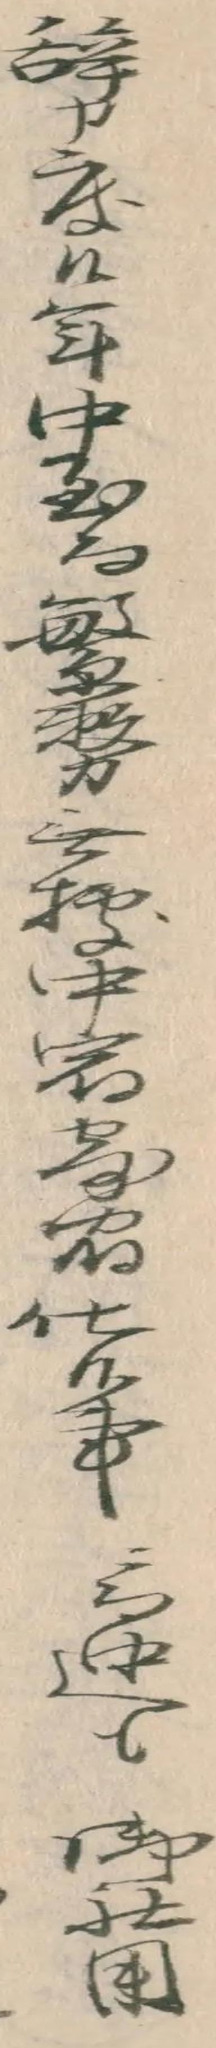辞申度候年中至而繁務無拠中宿寄宿仕候事ニ而迚も御社用
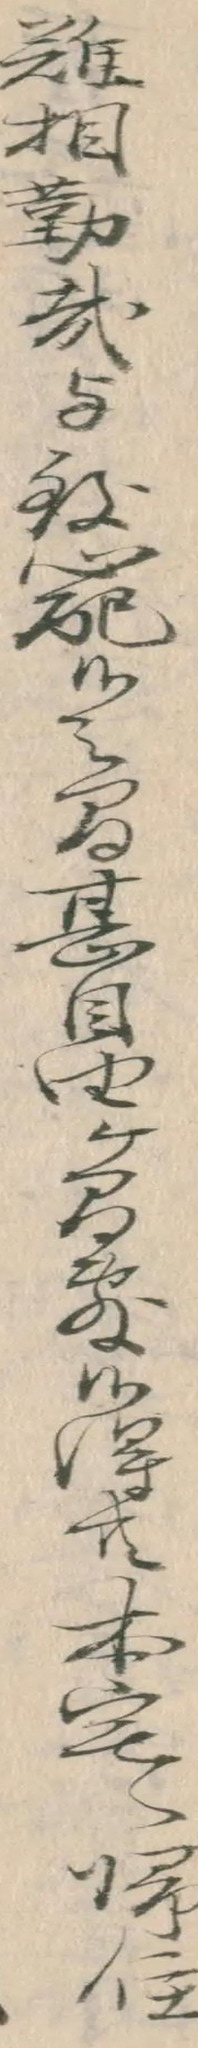難相勤哉と致心配候之間甚目由ヶ間敷候得共本宅へ帰住
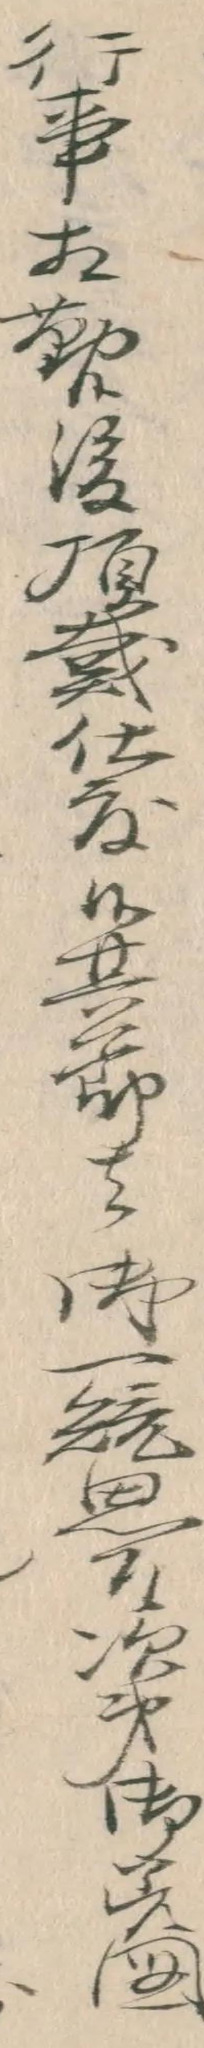行事相勤候後頂戴仕度候其節は御一統思召次第御差図
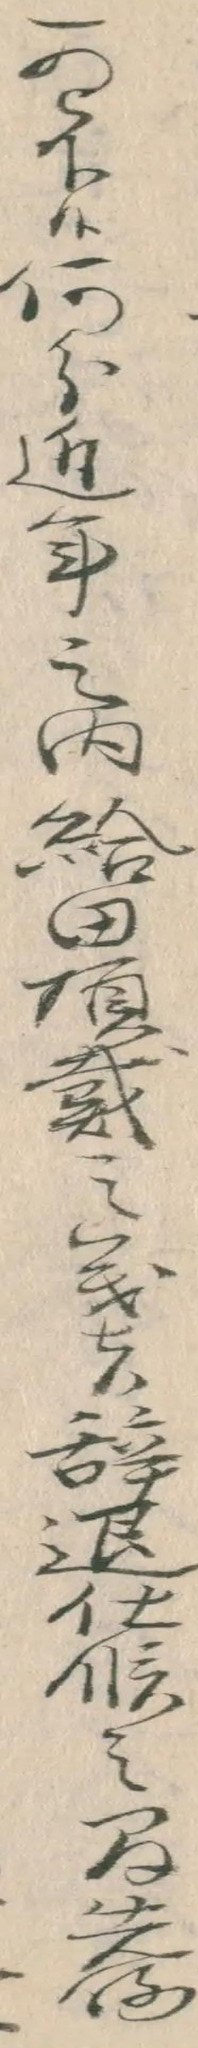可被下候何分近年之内給田頂戴之義は辞退仕候之間先例
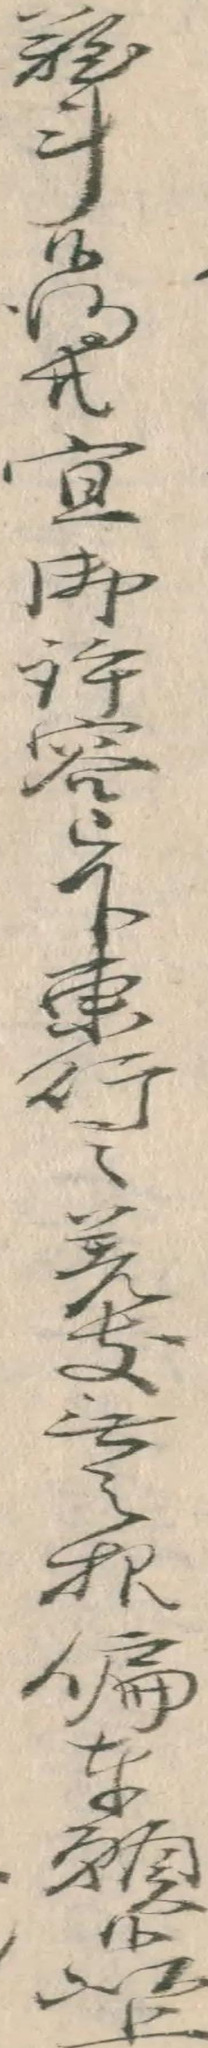難斗候得共宜御許容被下東行之差支無之様偏奉願候以上
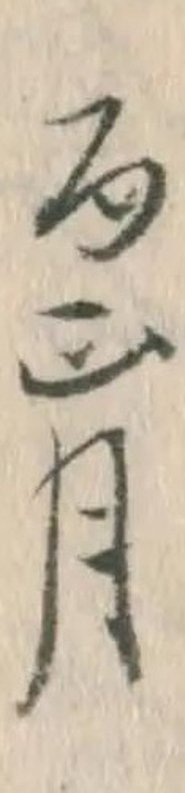酉正月
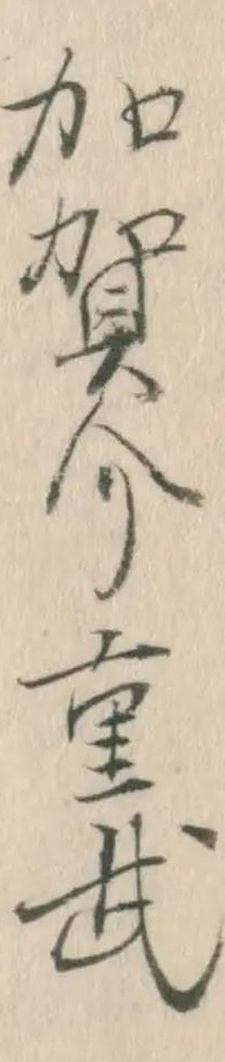加賀介重武
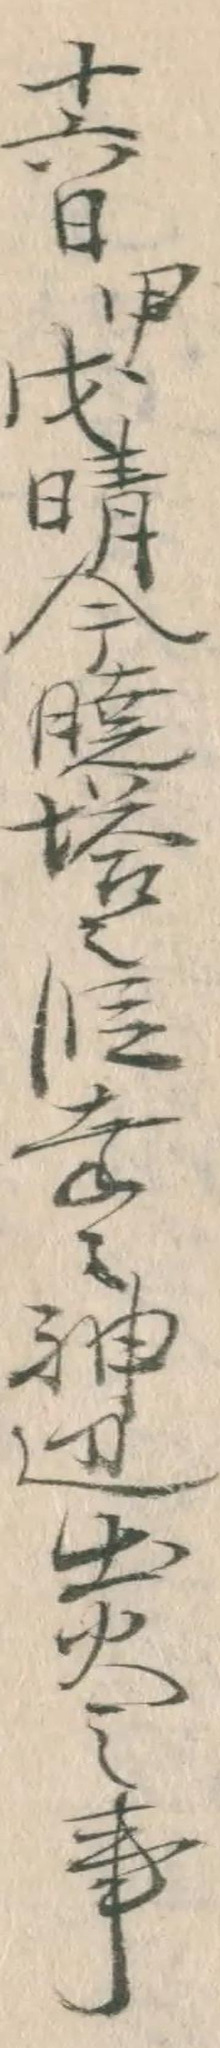十六日甲戌晴今暁塔之段幸之神辺出火之事
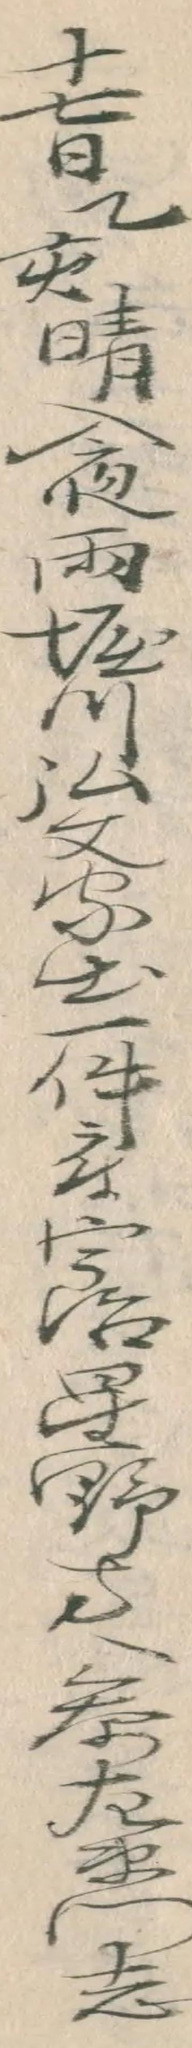十七日乙亥晴入夜雨堀川弘文家出一件ニ付宇治星野方へ参左衛門志
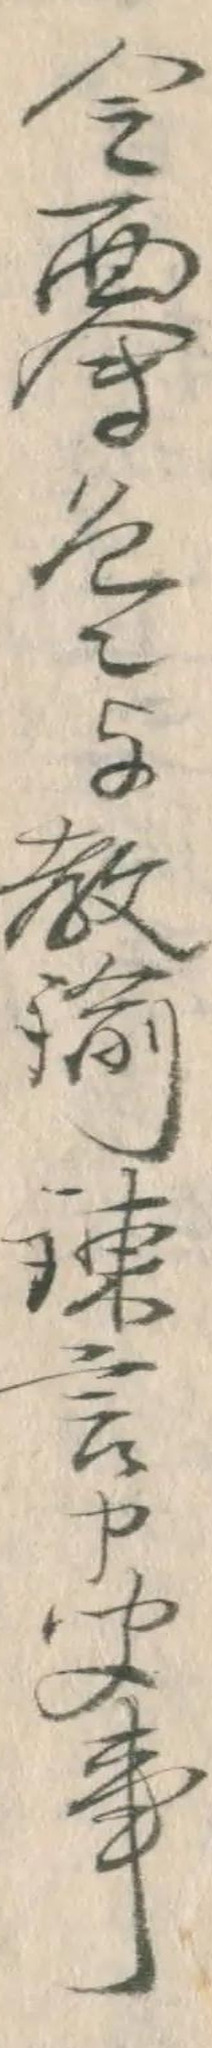令面會色〻と教諭諫言申聞事
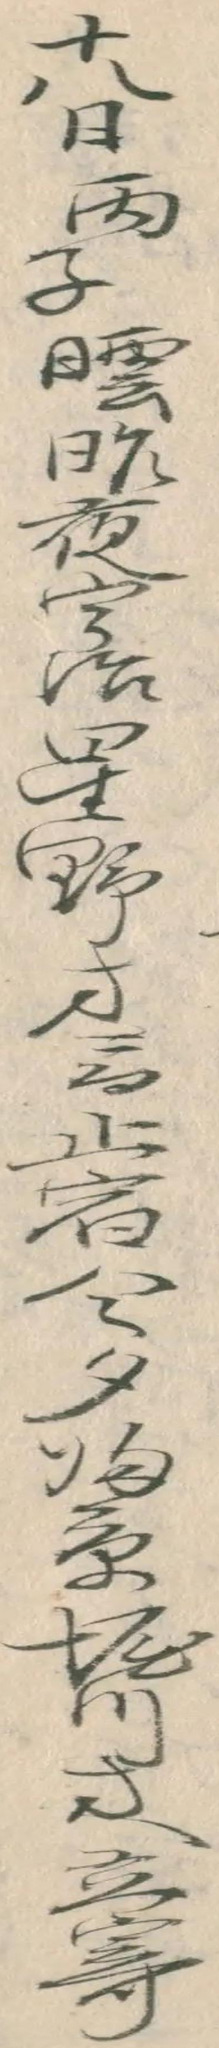十八日丙子曇昨夜宇治星野方ニ而止宿今夕帰草堀川方へ立寄
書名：賀茂社記録. 第65冊
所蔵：国立国会図書館 National Diet Library, JAPAN
